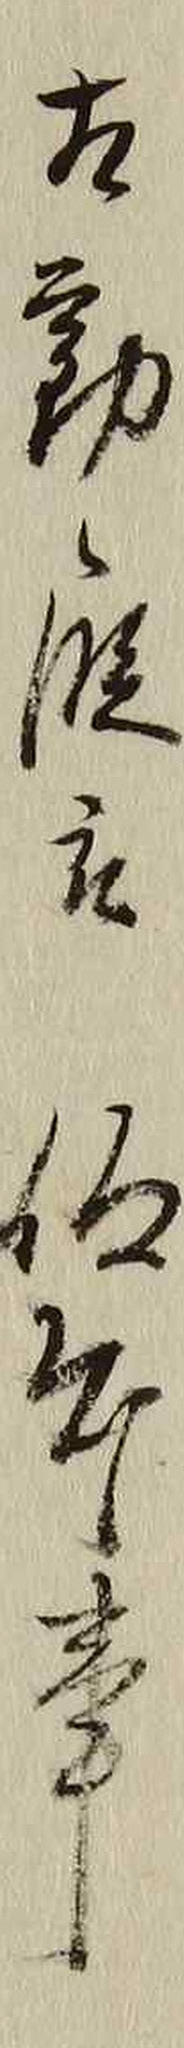相勤候段被仰出候事
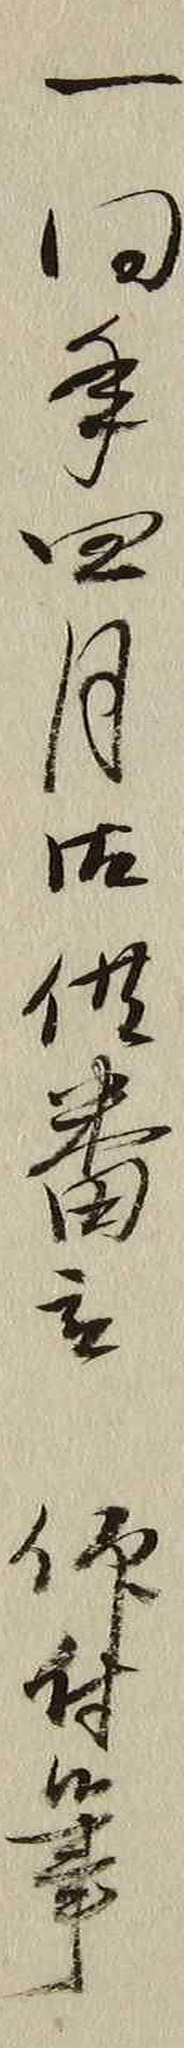一同年四月御供番被仰付候事
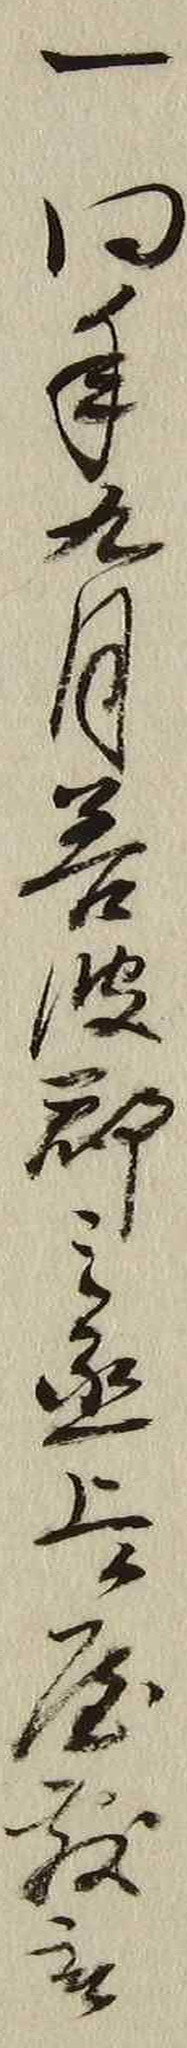一同年九月善波郡之丞上ヶ屋敷被
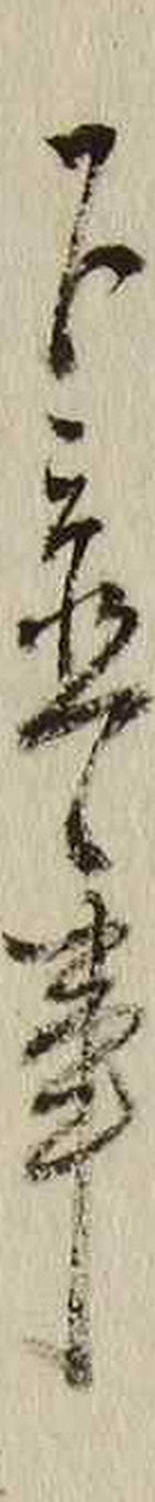下置候事
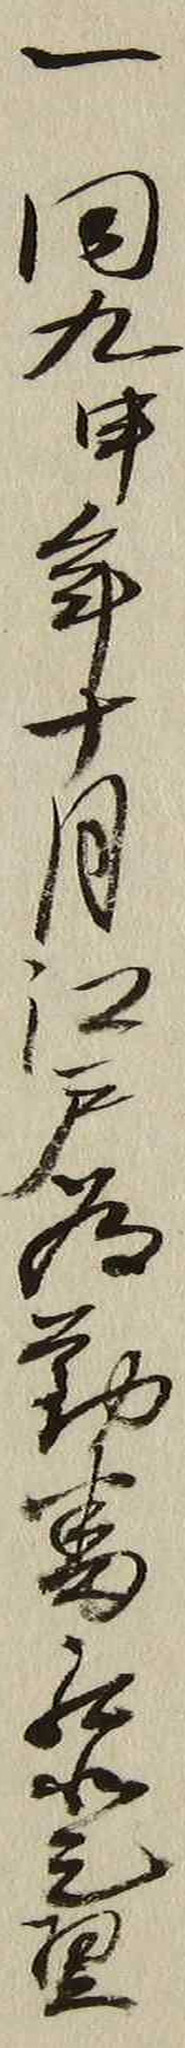一同九申年十月江戸為勤番罷登翌
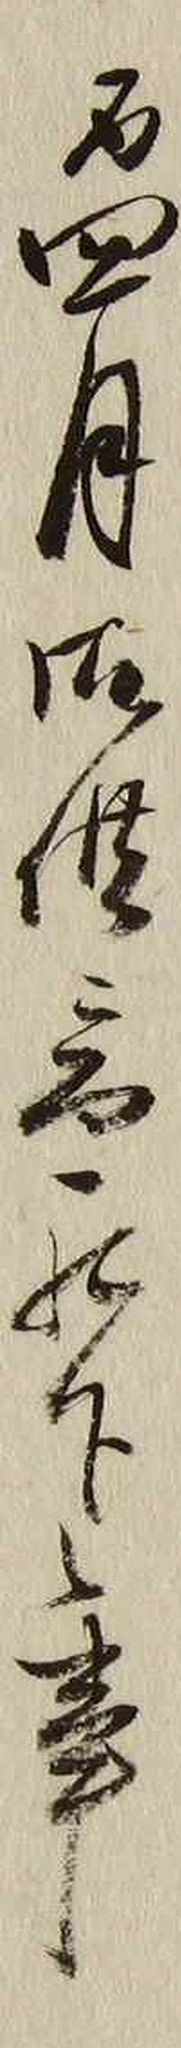酉四月御供ニ而罷下候事
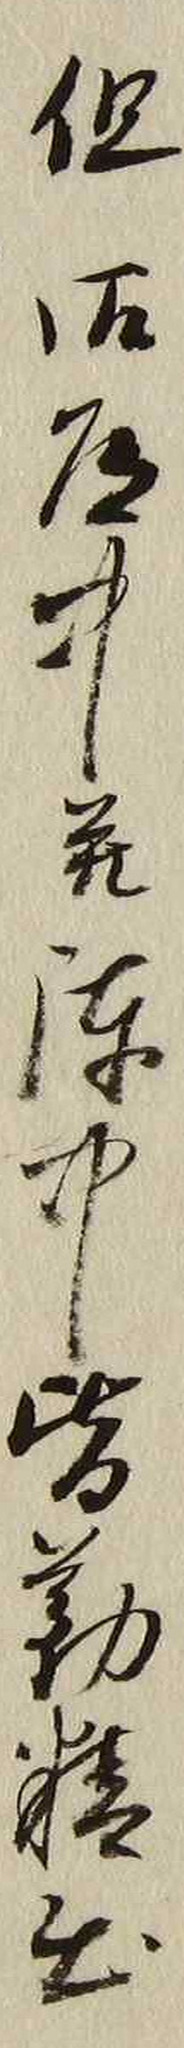但御道中并陣中皆勤精出
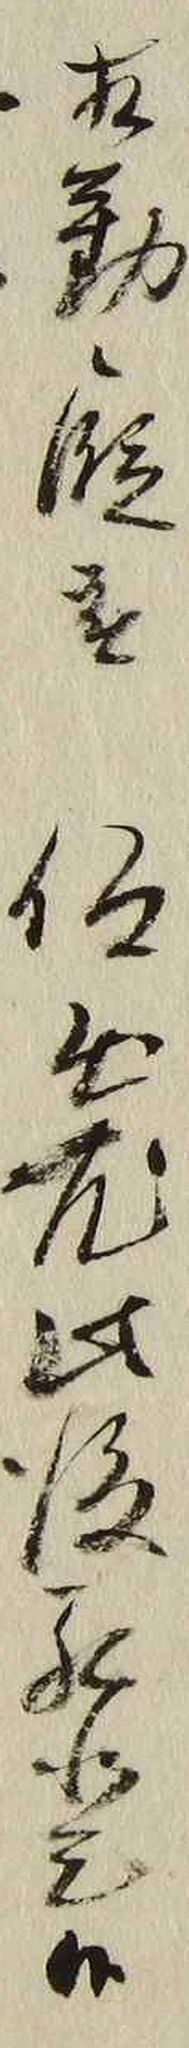相勤候段被仰出尤此後罷登候
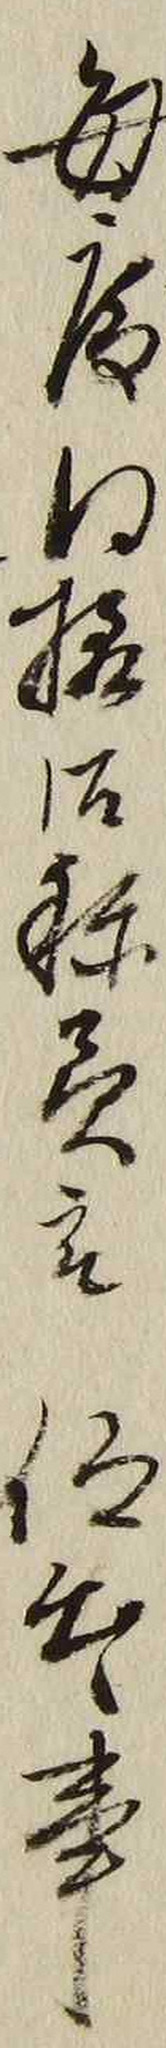毎度同様御称美被仰出候事
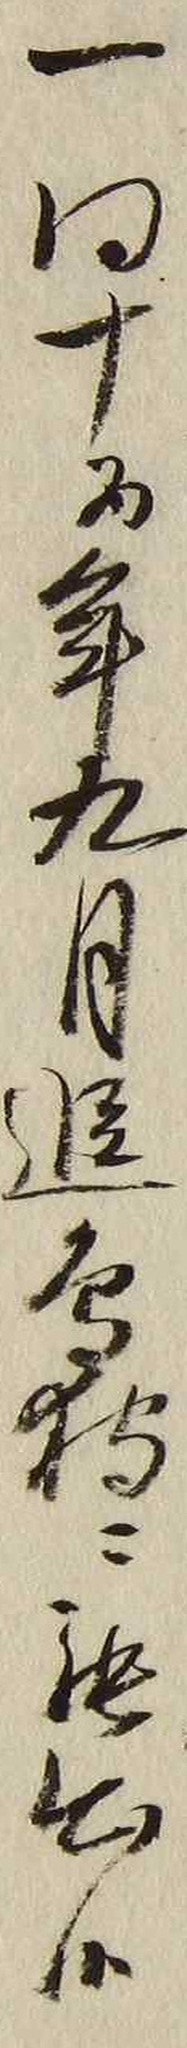一同十酉年九月追鳥狩ニ罷出候

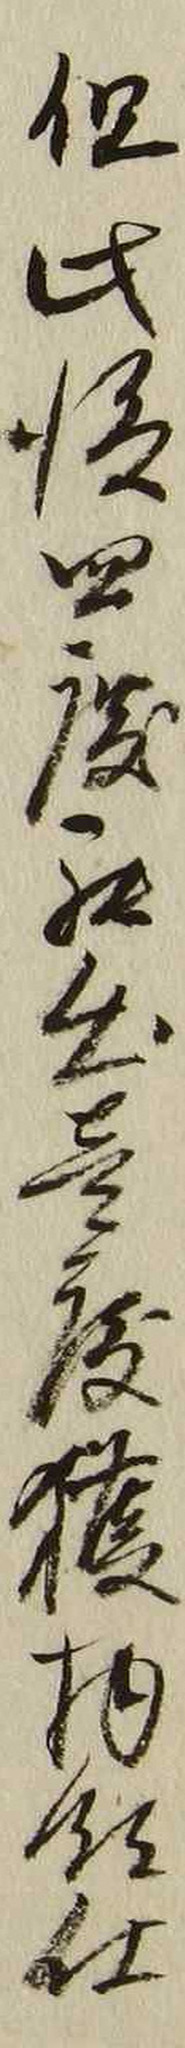但此後四度罷出壱度獲拝領仕
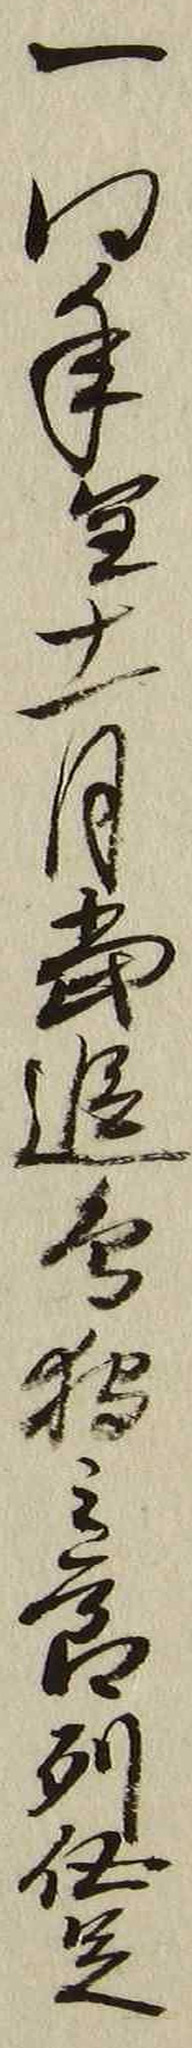一同年閏十一月当追鳥狩之節列伍足
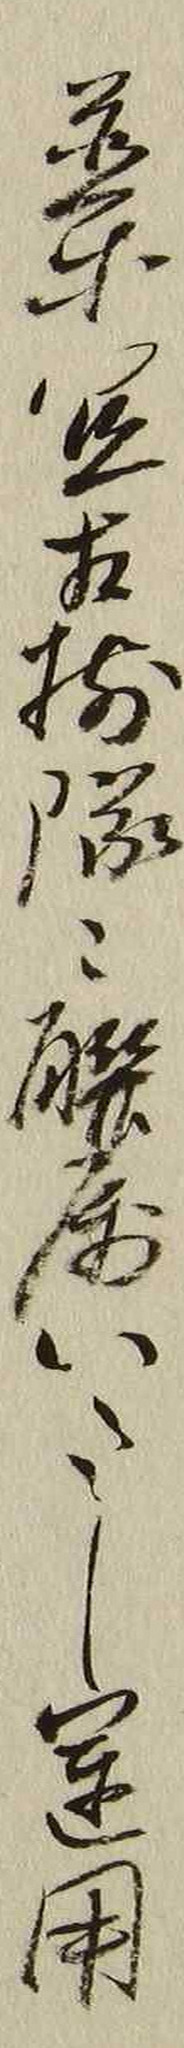並等宜相揃隊々聯属いたし運用
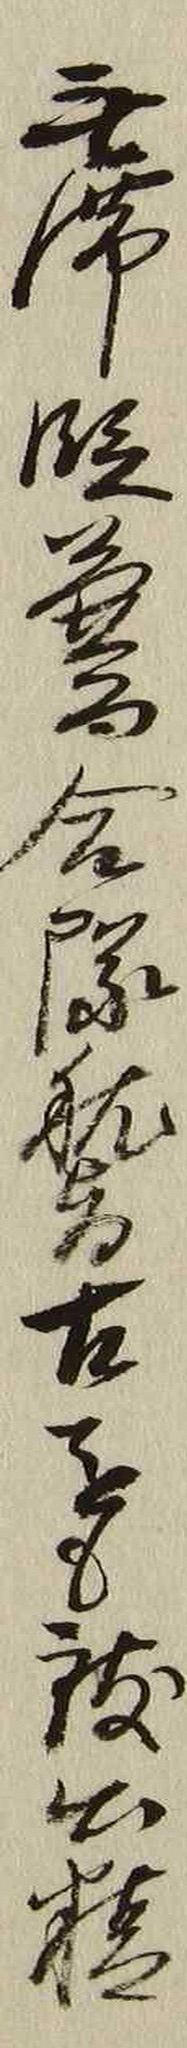無滞段兼而合隊稽古をも致出精
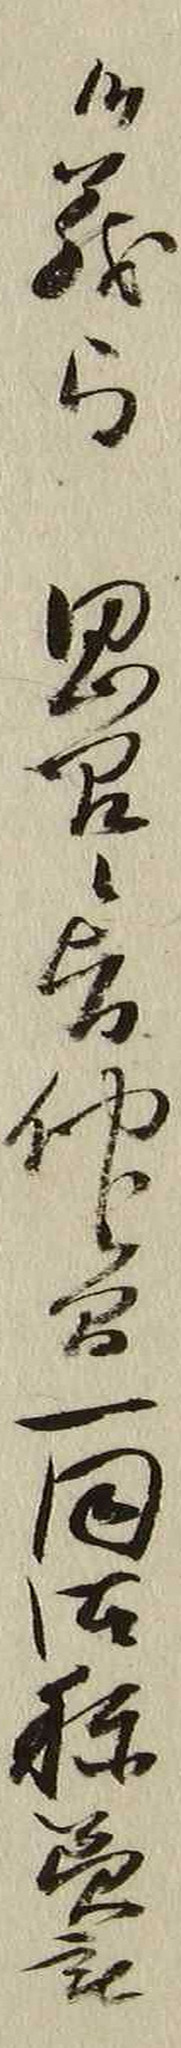候義与思召之旨仲間一同御称美被
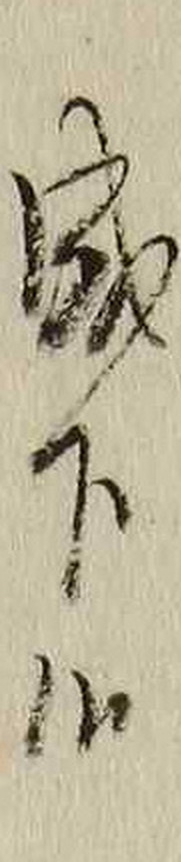成下候
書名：諸士系譜　巻之352　す之部2
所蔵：会津若松市立会津図書館
